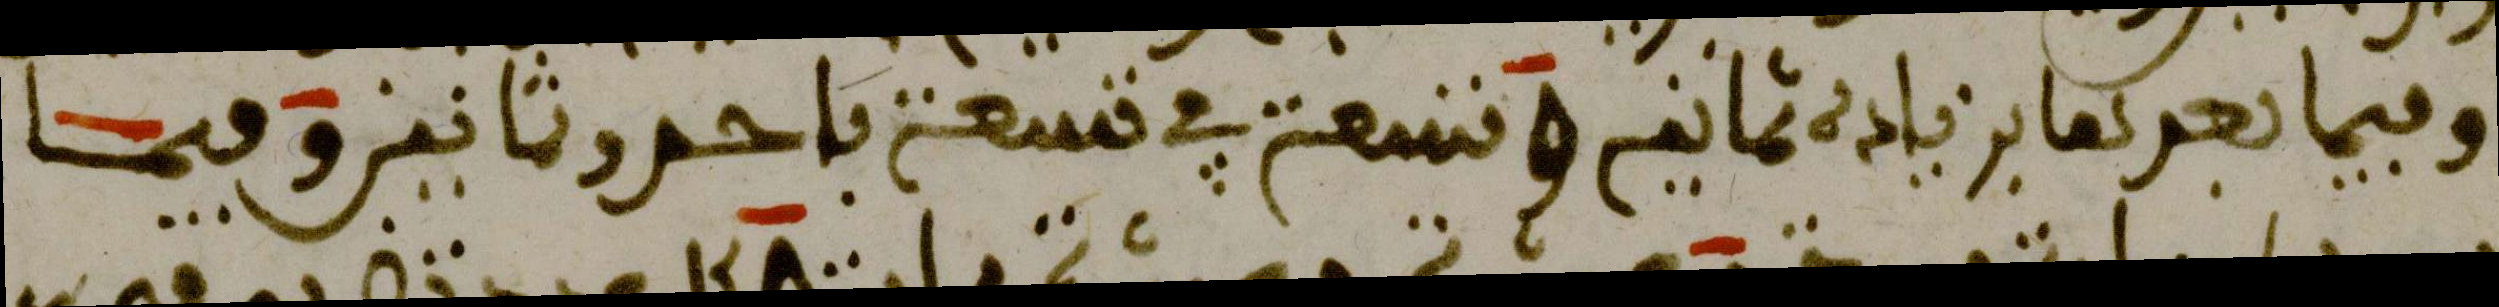و فيما بعدها بزيادة ثمانية و تسعة في تسعة باحد و ثمانين و فيما
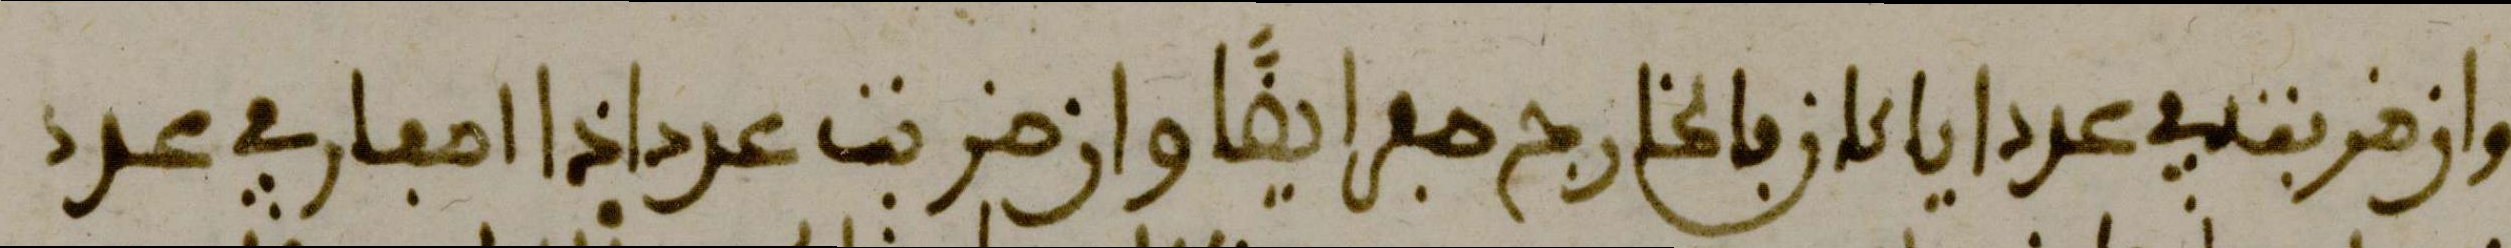و ان ضربته في عدد ايا كان فالخارج صفر ايضا و ان ضربت عددا ذا اصفار في عدد
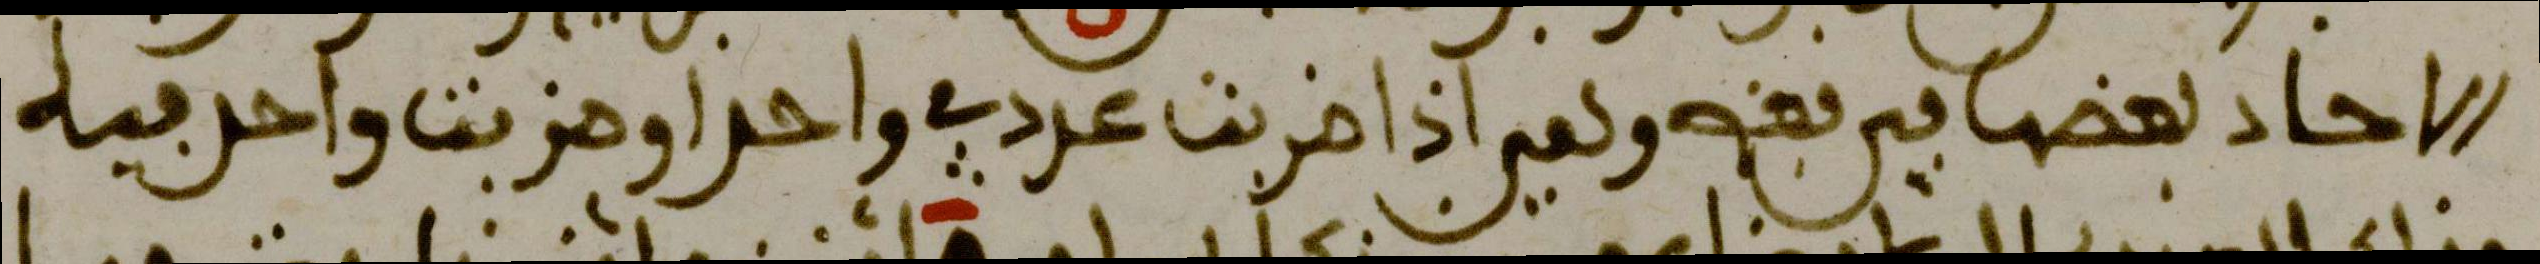الاحاد بعضها في بعض و هي اذا ضربت عدد في واحدا و ضربت واحد فيه
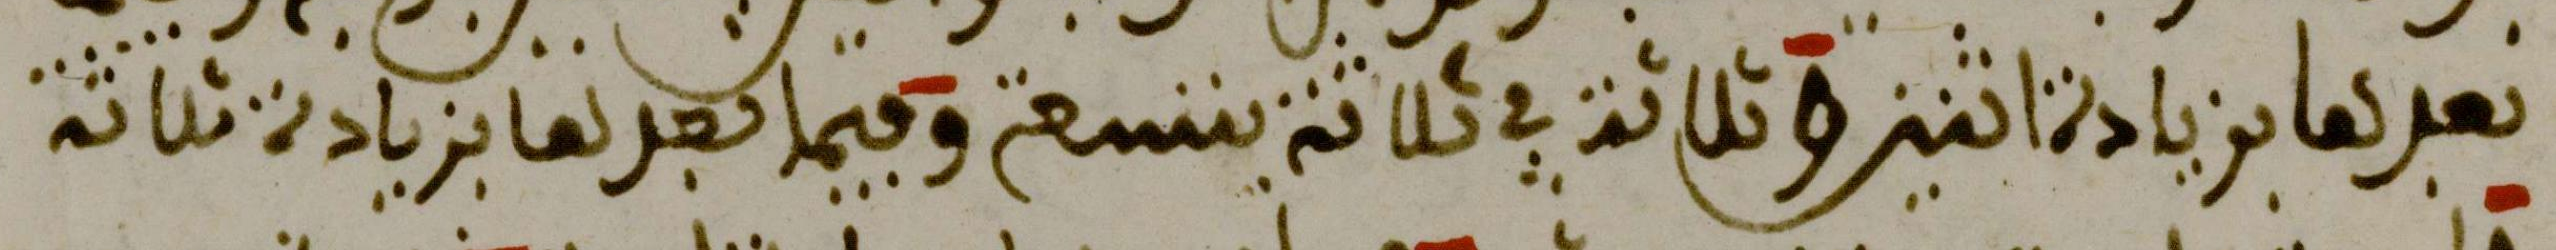بعدها بزيادة اثنين و ثلاثة في ثلاثة بتسعة و فيما بعدها بزيادة ثلاثة
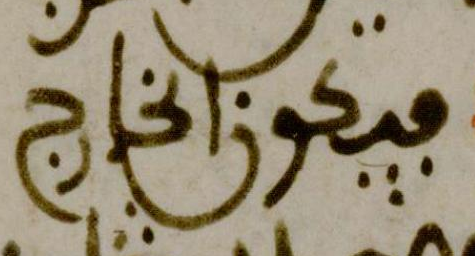فيكون الخارج
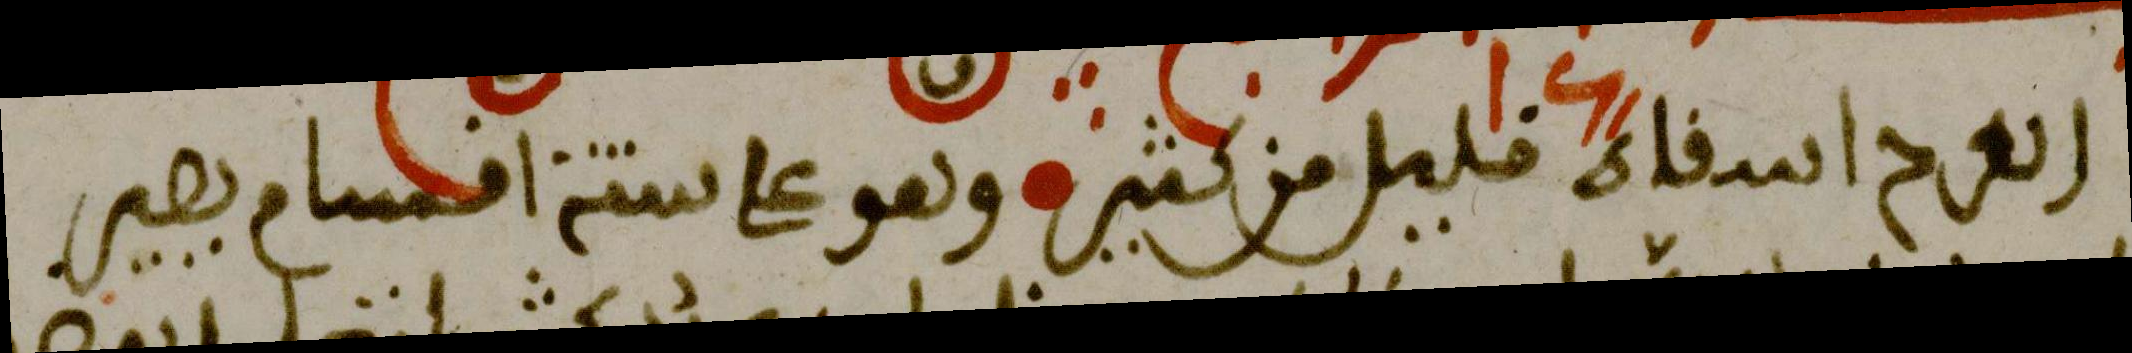الطرح اسقاط قليل من كثير و هو على ستة اقسام يصير
